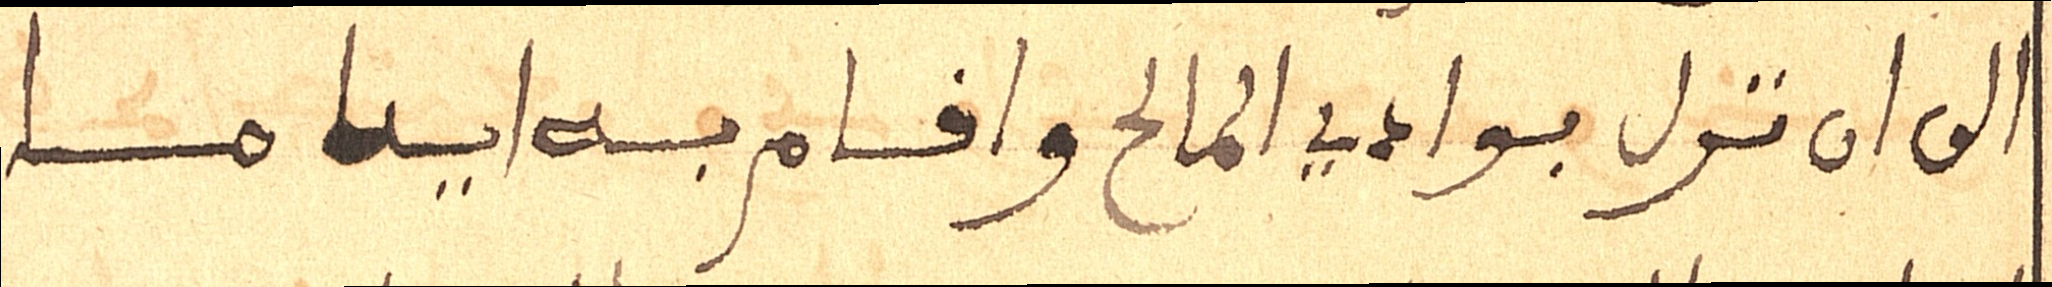الى ان ترل بوادي المالح واقام به اياما
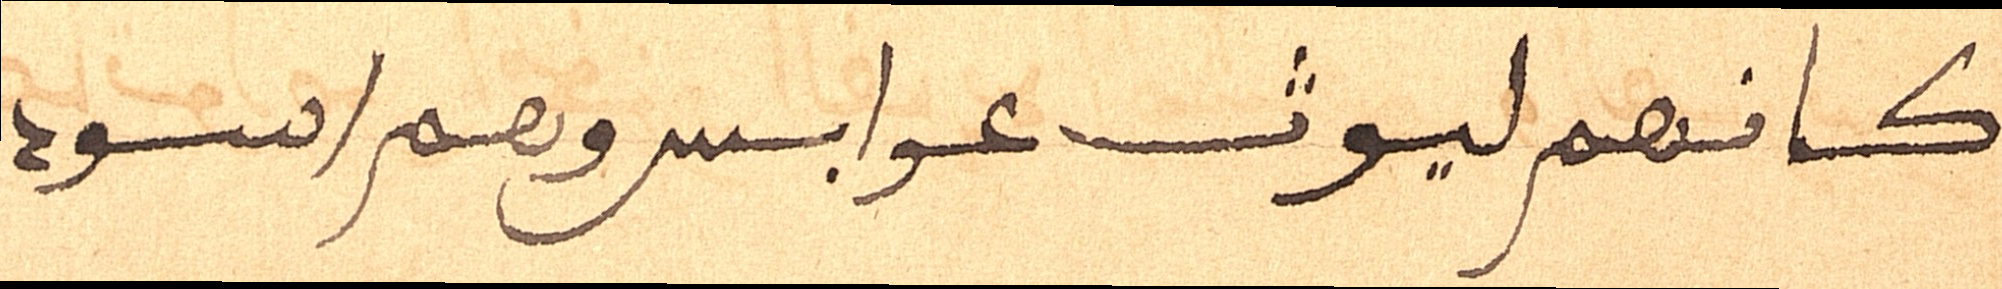كانهم ليوث عوابس وهم اسود
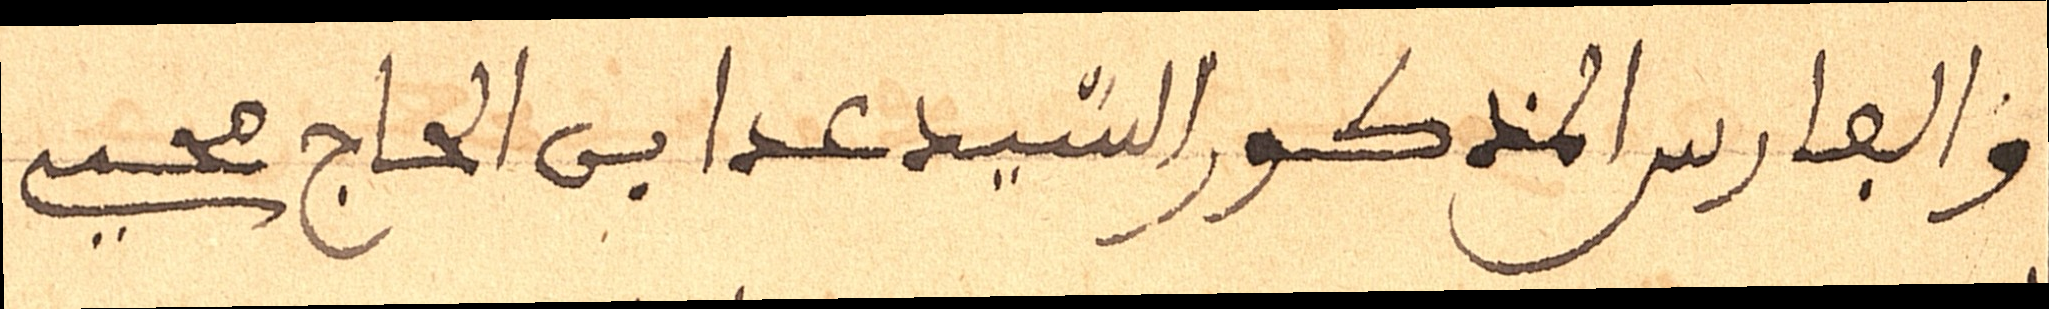والفارس المذكور السيد عد ابن الحاج محي
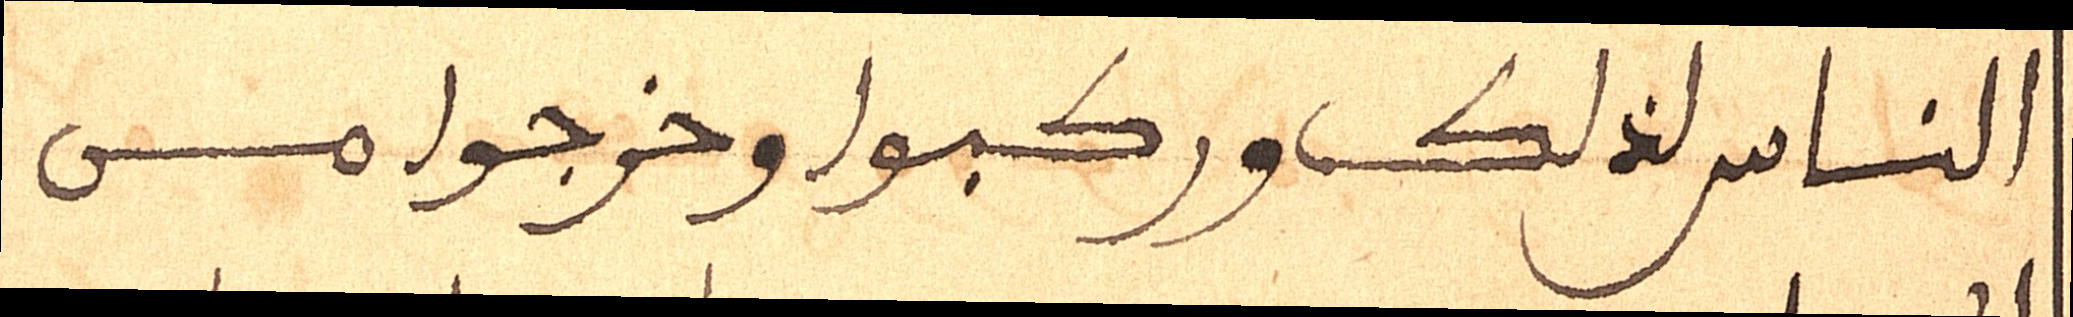الناس لذلك وركبوا وخرجوا من
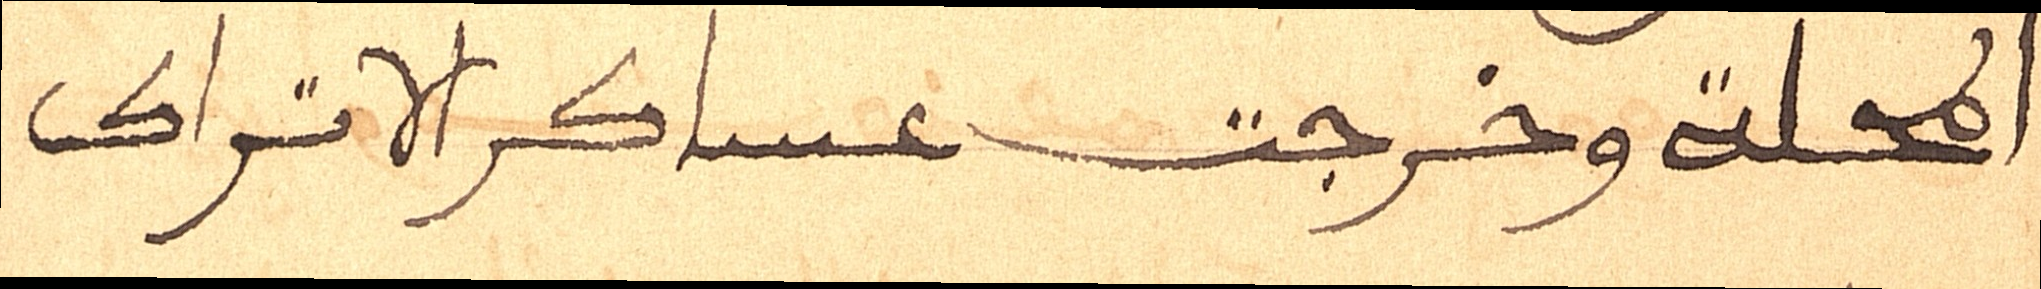المحلة وخرجت عساكر الاتراك
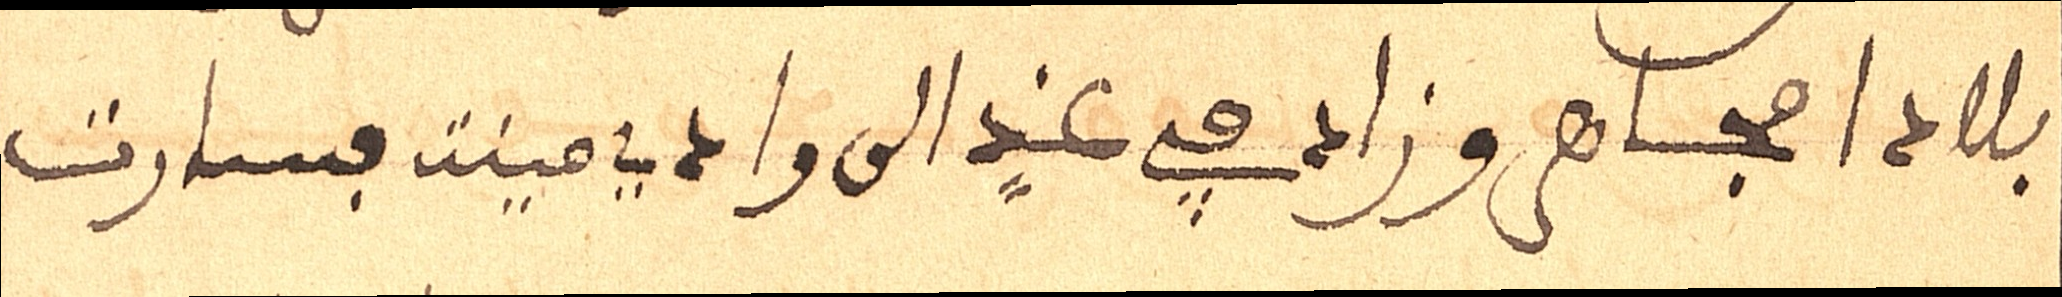بلادا مجاهر وزاد في غد الى وادي مينت فسارت
